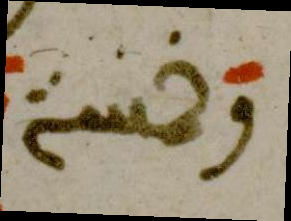وَخمسة
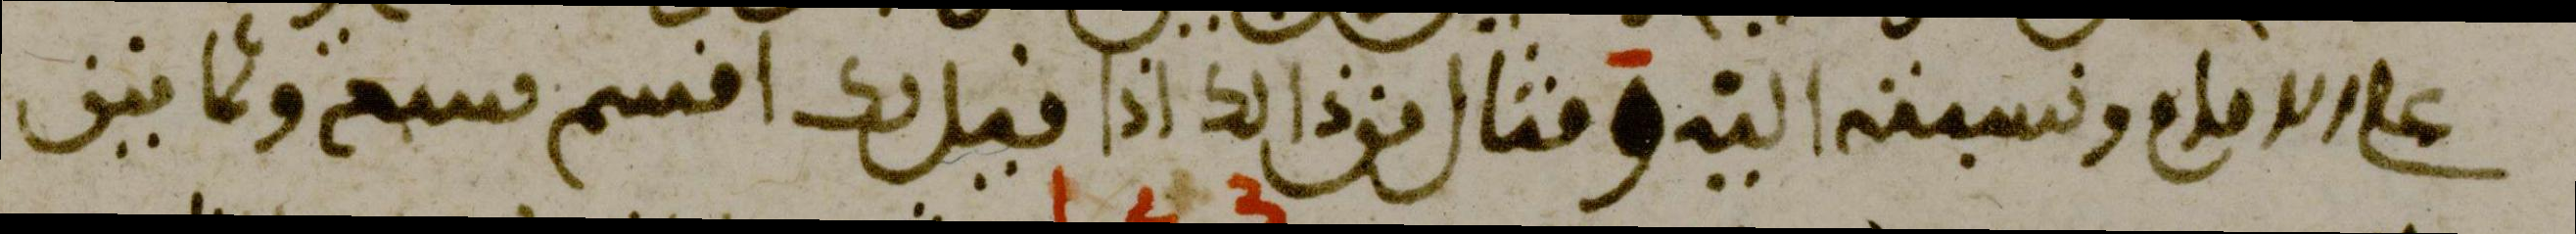على الامام ونسبته اليْه وَمثال من ذالك اذا قيل لك اقسم سبعة وثمانين
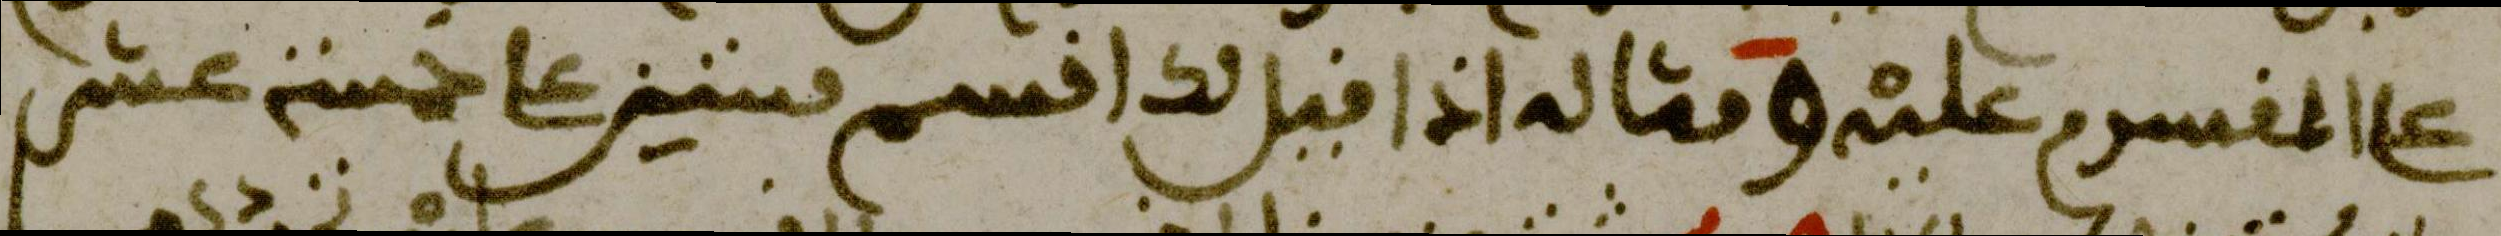على المقسوم عليْه وَمثاله اذا قيل لك اقسم ستين على خمسة عشر
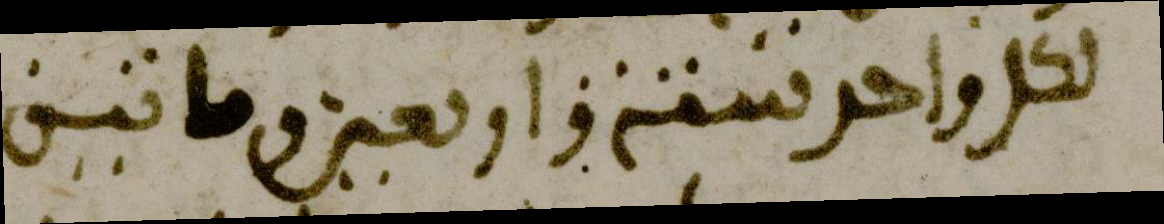لكل واحد ستة واربعين وماتين
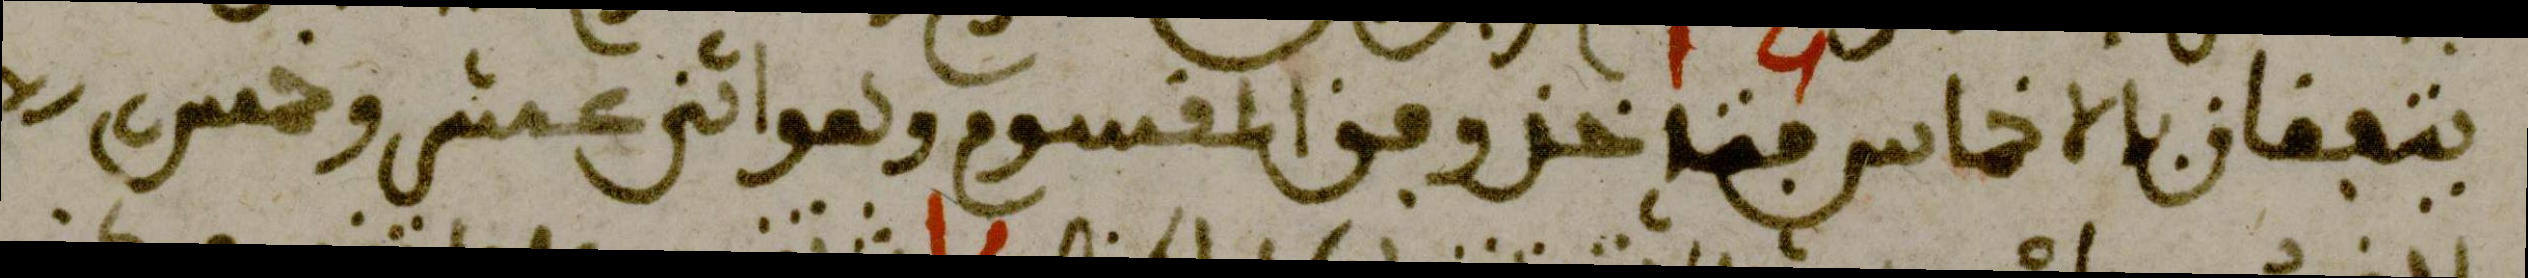يتفقان بالاخماس فتاخذ وفق المقسوم وهو اثنى عشر وخمس
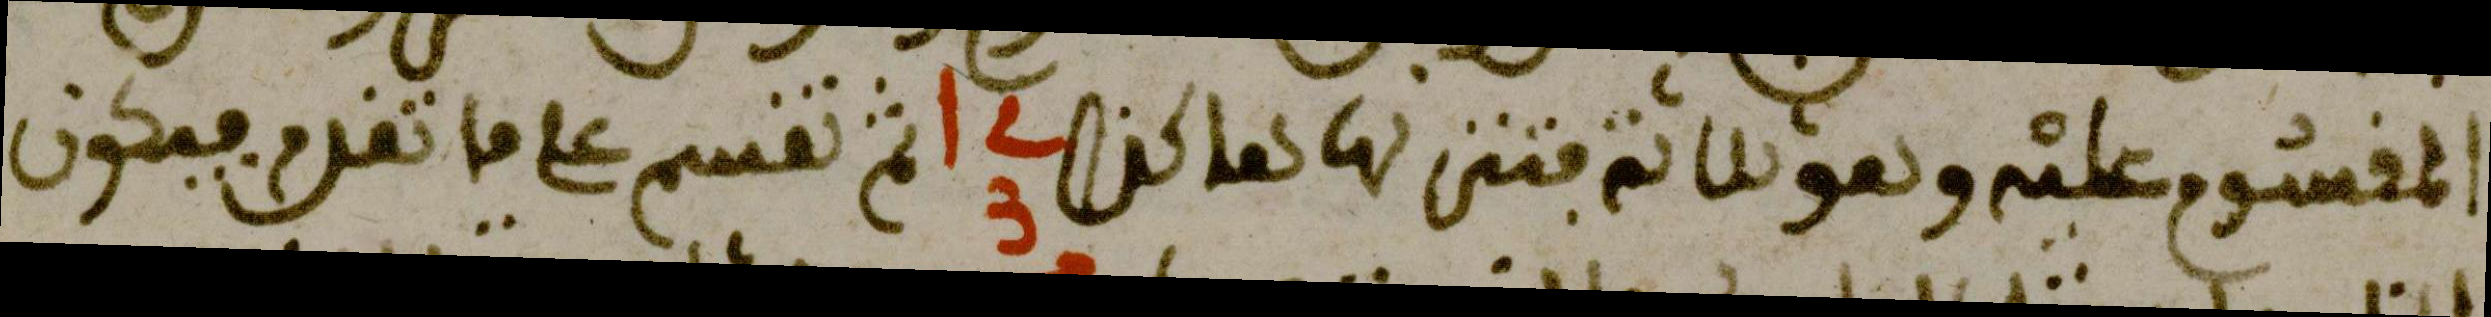المقسُوم عليْه وهو ثلاثة فتنزلها هاكذا 12 ثم تقسم على ما تقدم فيكون
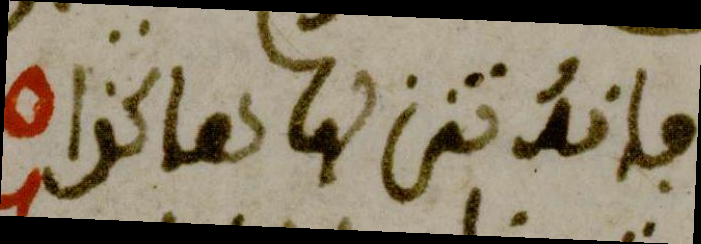فانك تنزلها هاكذا
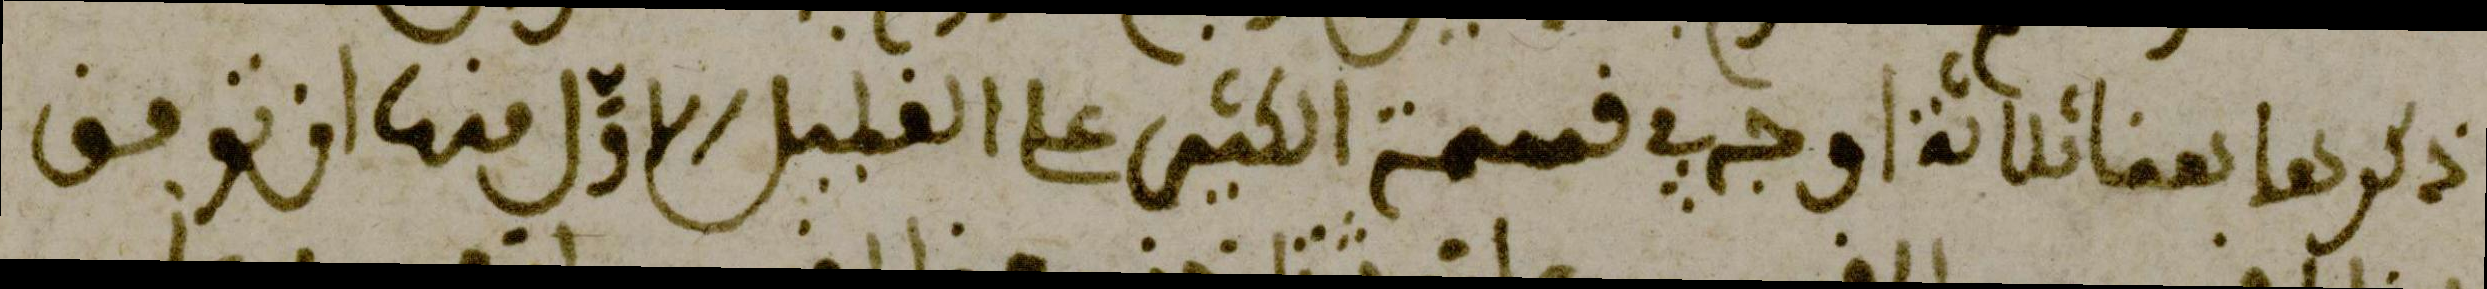ذكرها هنا ثلاثة اوجه في قسمة الكثير على القليل الاوّل منها ان توفق
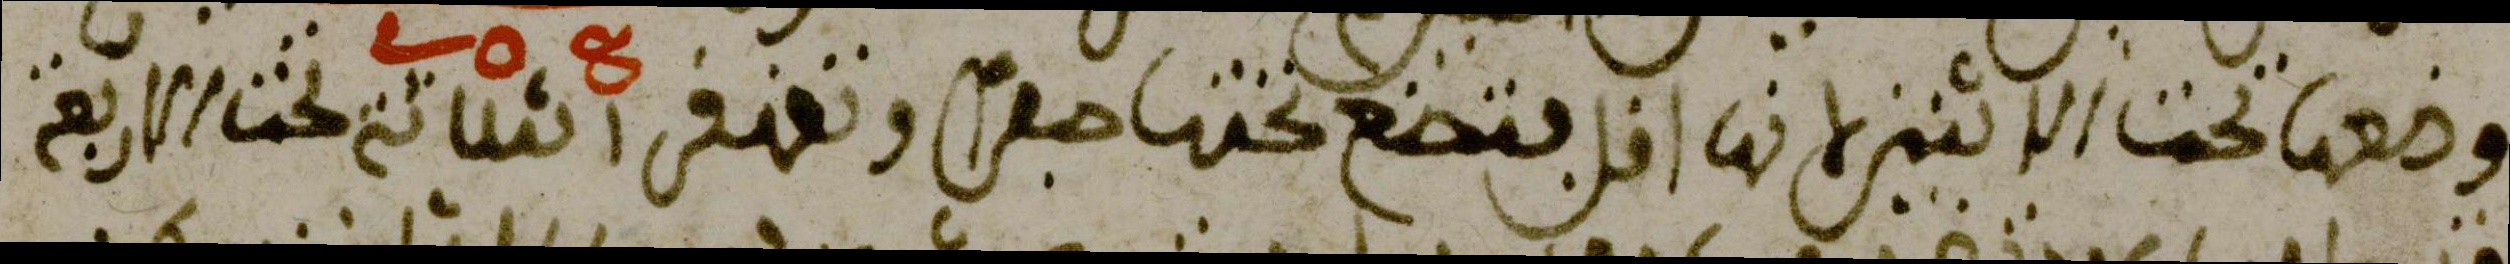وضعها تحت الاثنين لانها اقل فتضع تحتها صفرا وتقهقر الثلاثة تحت الاربعة
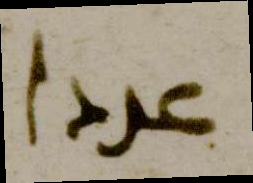عددا
